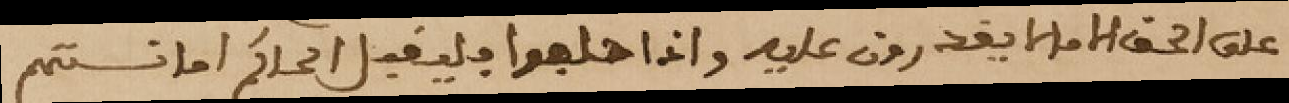على الحق الا ما لا يقدرون عليه واذا حلفوا فليقبل الحاكم امانتهم
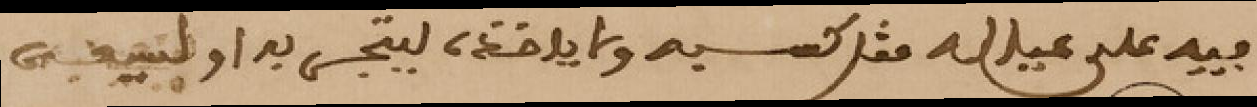فيه على عياله مثل كسبه ولا ياخذه ليتجر به او ليسعى
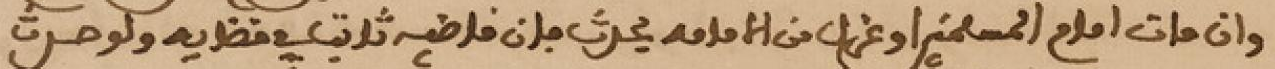وان مات امام المسلمين او عزل من الامامه يحدث فان قاضيه ثلاث في قضايه ولو حدث
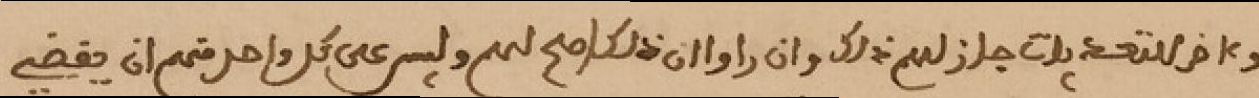و ءاخر للتعديلات جاز لهم ذلك وان راوا ان ذلك اصح لهم وليس على كل واحد منهم ان يقضي
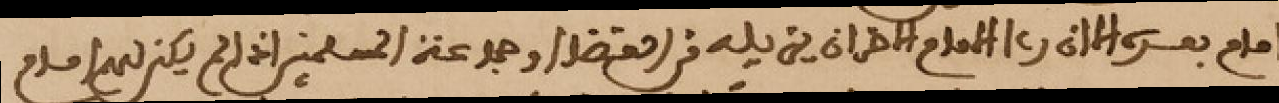امام بعده الا ان رءا الامام الاخر ان يزيله من القضا او جماعة المسلمين اذا لم يكن لهم امام
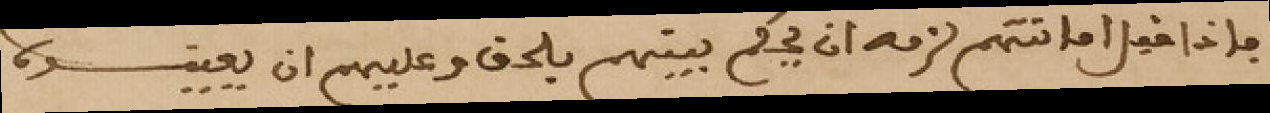فاذا قبل امانتهم لزمه ان يحكم بينهم بالحق وعليهم ان يعينوه
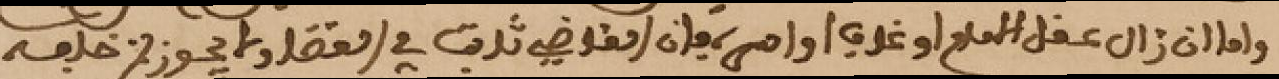واما ان زال عقل الامام او غاب او اسره فان القاضي ثابت في القضا ولا يجوز من خلفه
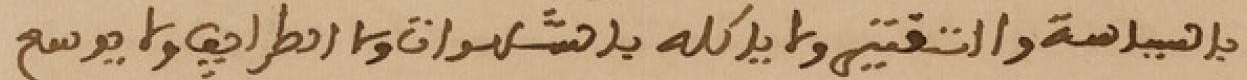بالسياسة والتقتير ولا ياكله بالشهوات ولا الطرايق ولا يوسع
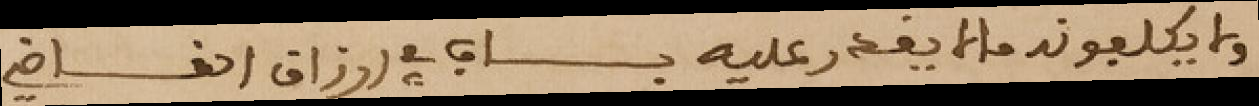ولا يكلفونه ما لا يقدر عليه باب في ارزاق القاضي
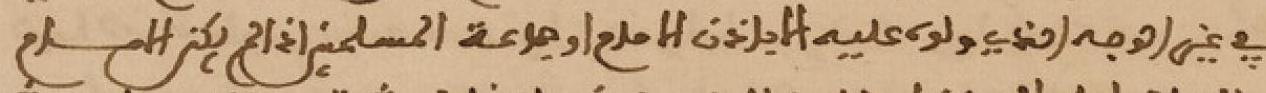في غير الوجه الذي ولوه عليه الا باذن الامام او جماعة المسلمين اذا لم يكن الامام
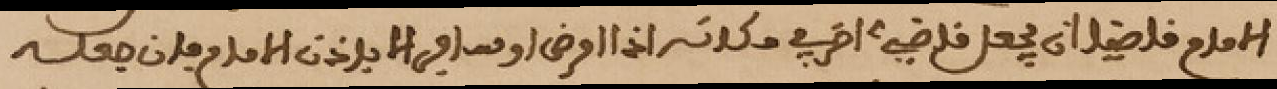الامام قاضيا ان يجعل قاضي ءاخر في مكانه اذا امرض او سافر الا باذن الامام فان جعله
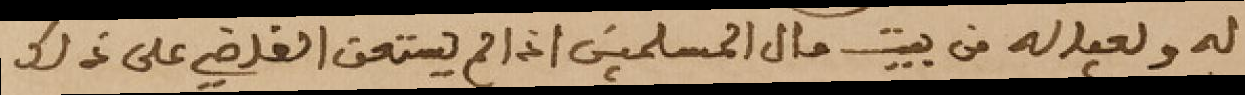له ولعياله من بيت مال المسلمين اذا لم يستعن القاضي على ذلك
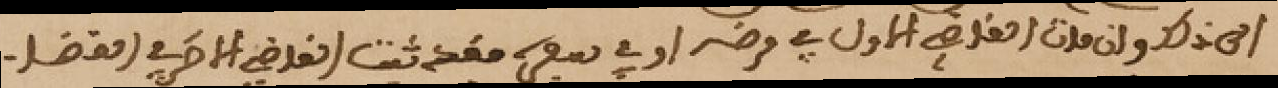الى ذلك وان مات القاضي الاول في مرضه او في سفره فقد ثبت انما القاضي الاخر في القضاء
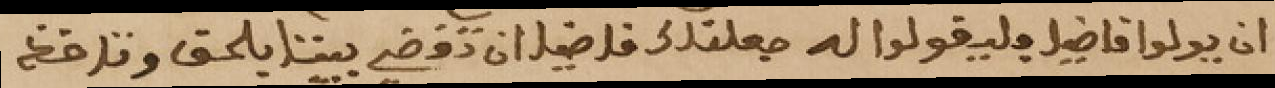ان يولوا قاضيا فليقولوا له جعلناك قاضيا ان تقضي بيننا بالحق وتاحذ
